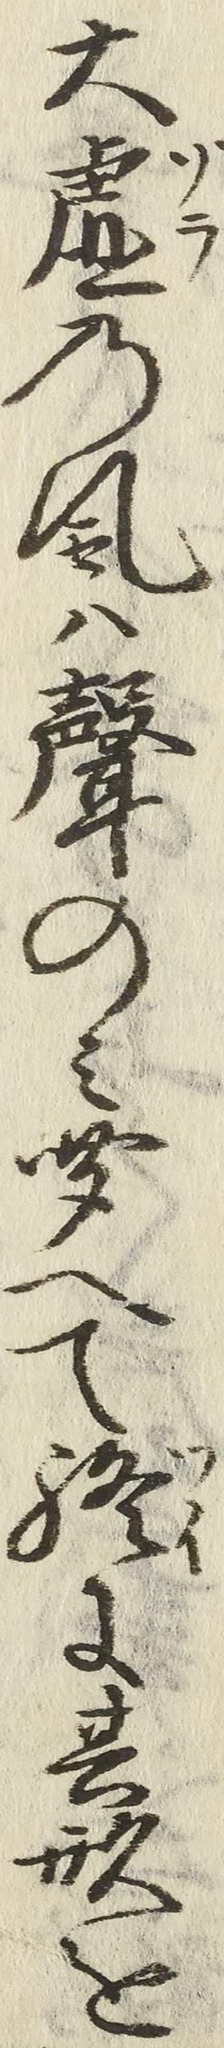大虚の風は声のみ聞へて終に其形を
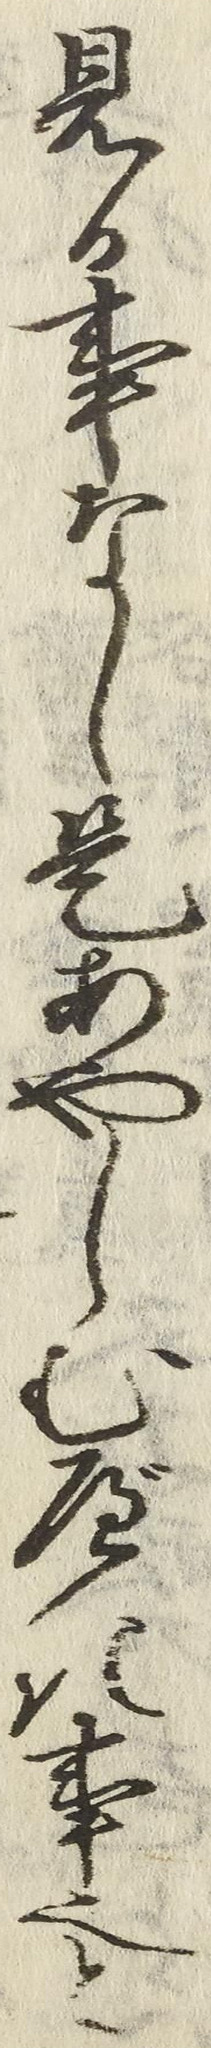見る事なし是あやしむべき事也と
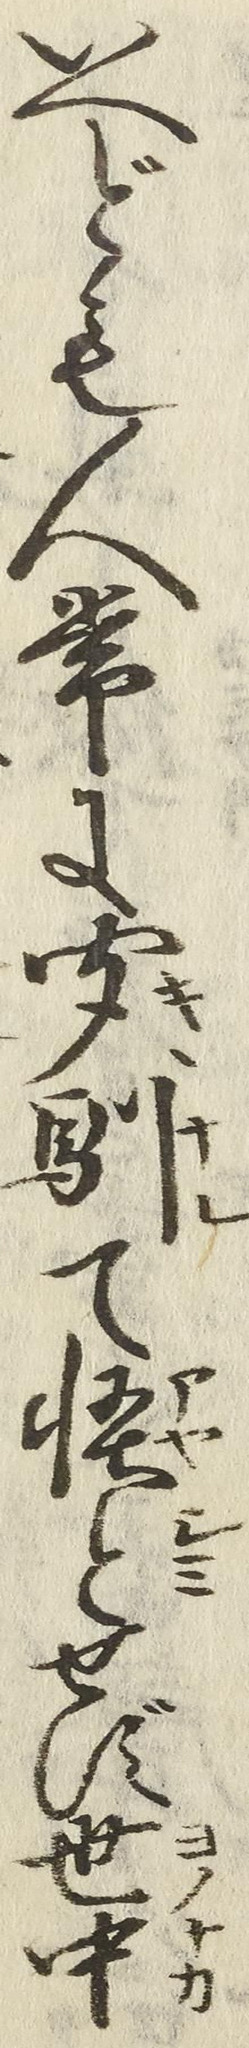いへども人常に聞馴て怪とせず世中
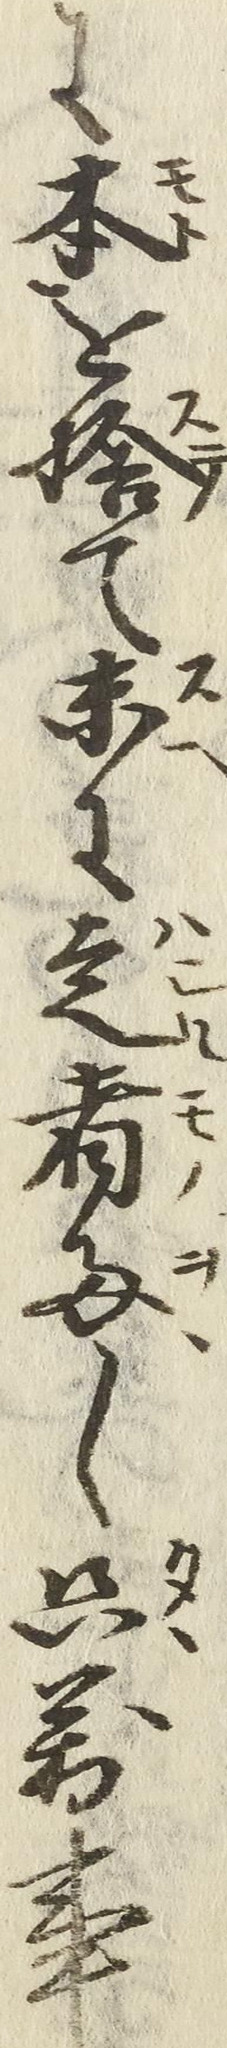に本を捨て末に走者多し只万事
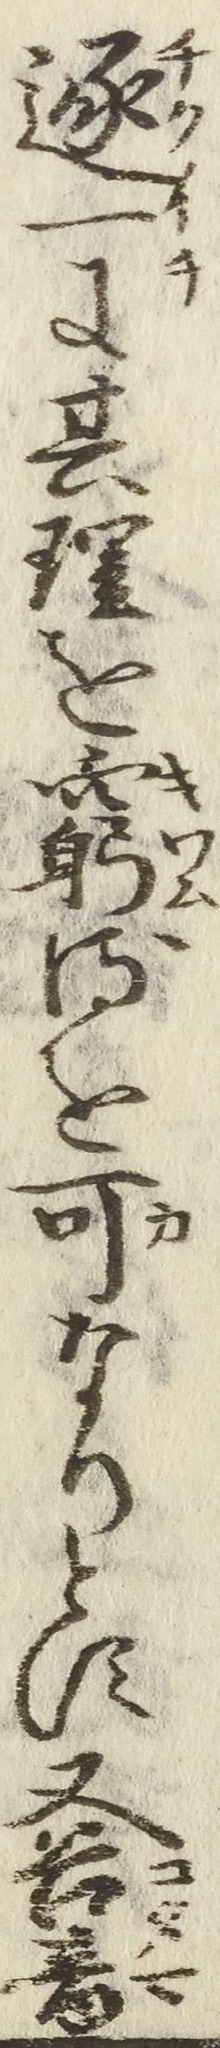逐一に其理を窮るを可なりとす又谷音
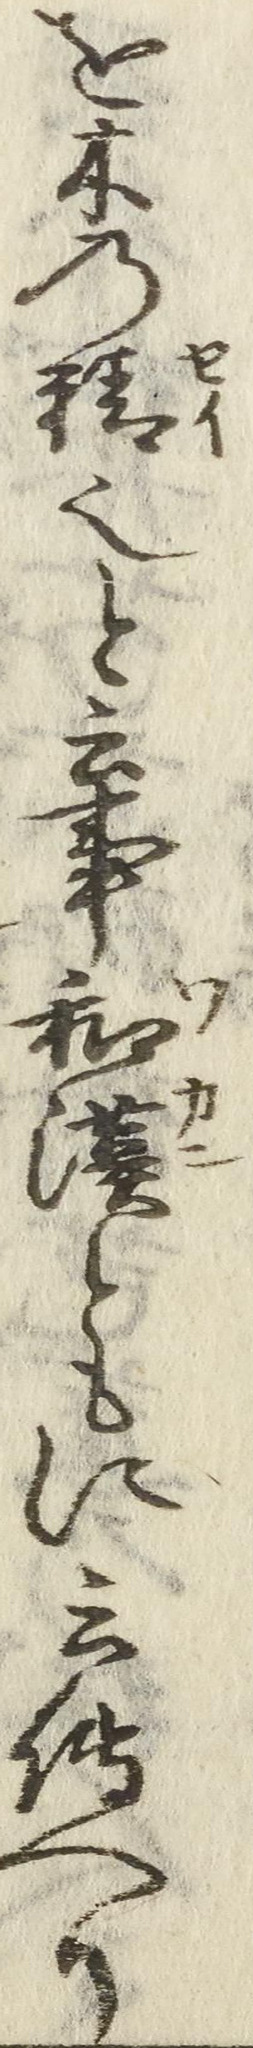を木の精也と云事和漢ともに云伝へり
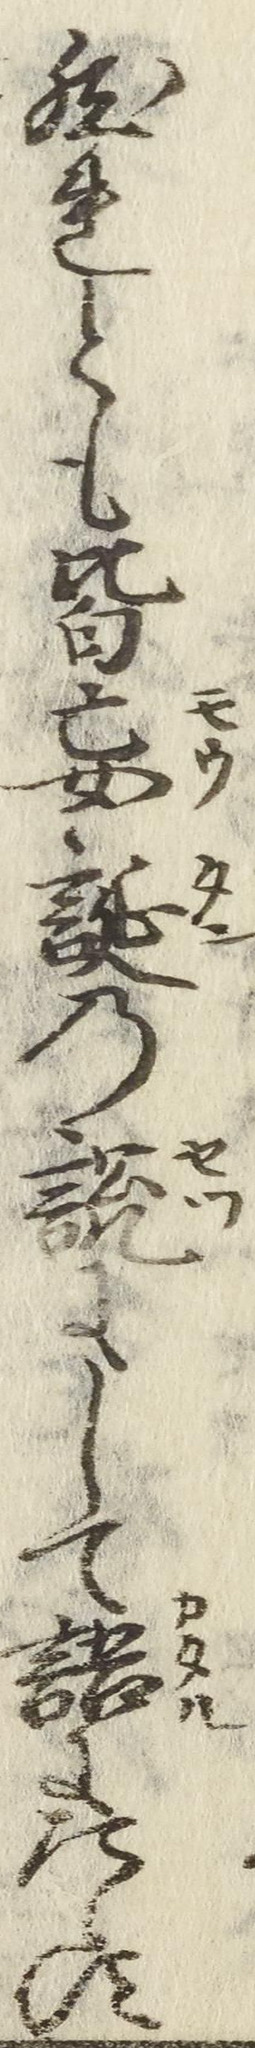然れとも皆妄誕の説にして語にたらす
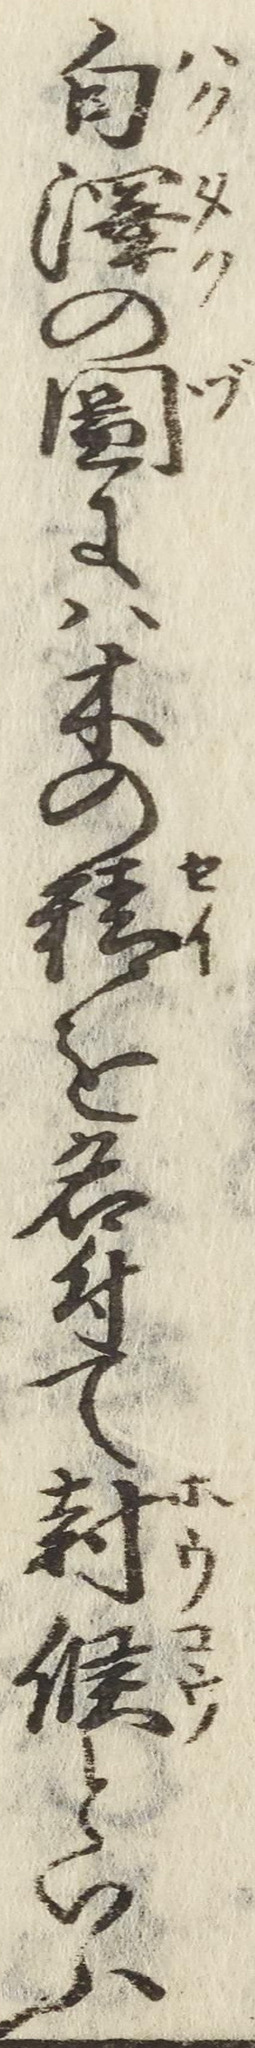白澤の図には木の精を名付て封侯といふ
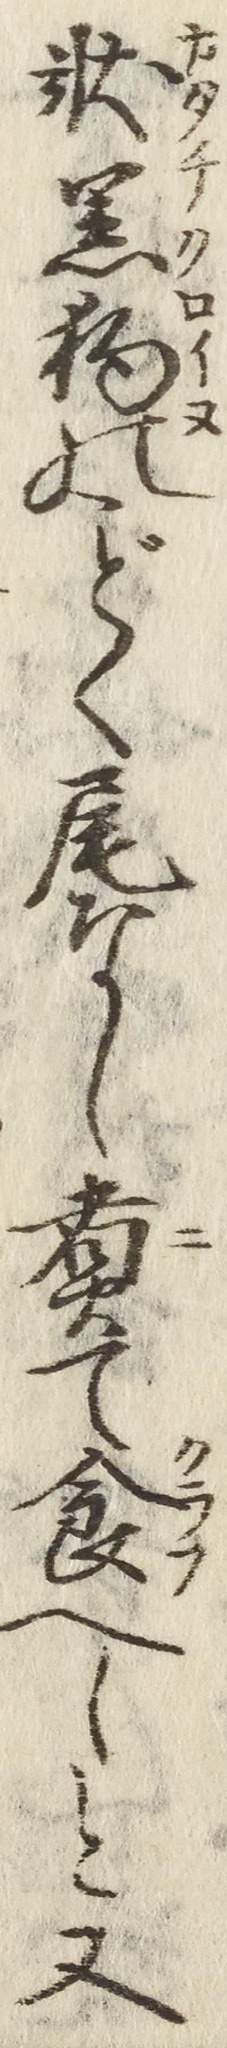状黒狗のごとく尾なし煮て食へしと又
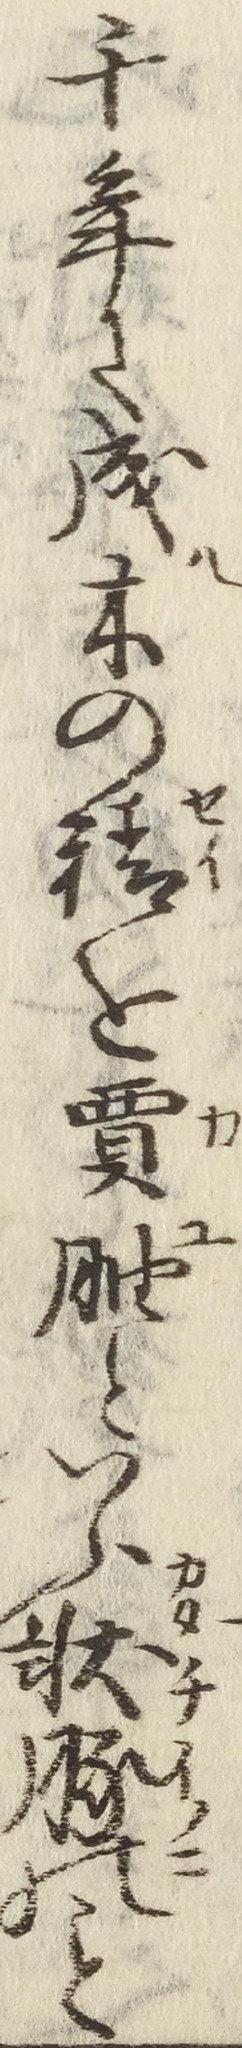千年に成ル木の精を賈油といふ状豚のこと
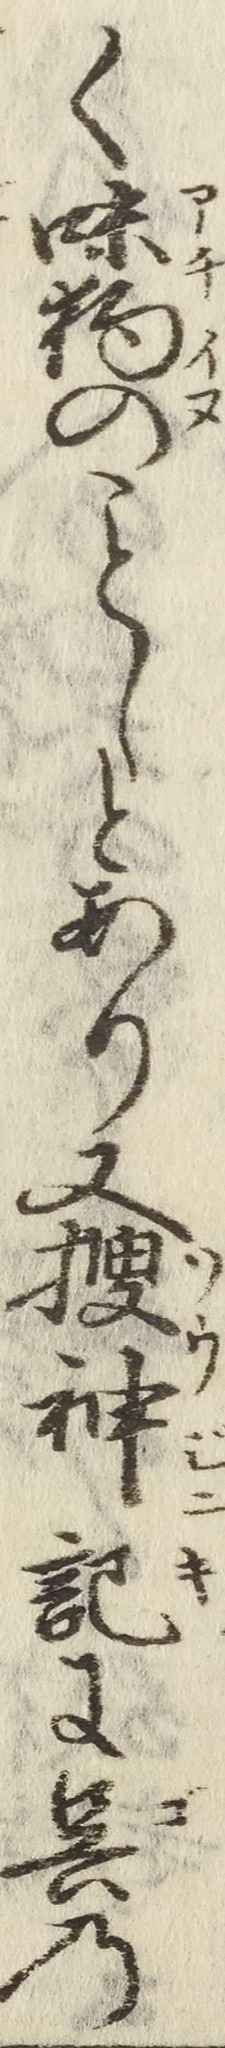く味狗のことしとあり又捜神記に呉の
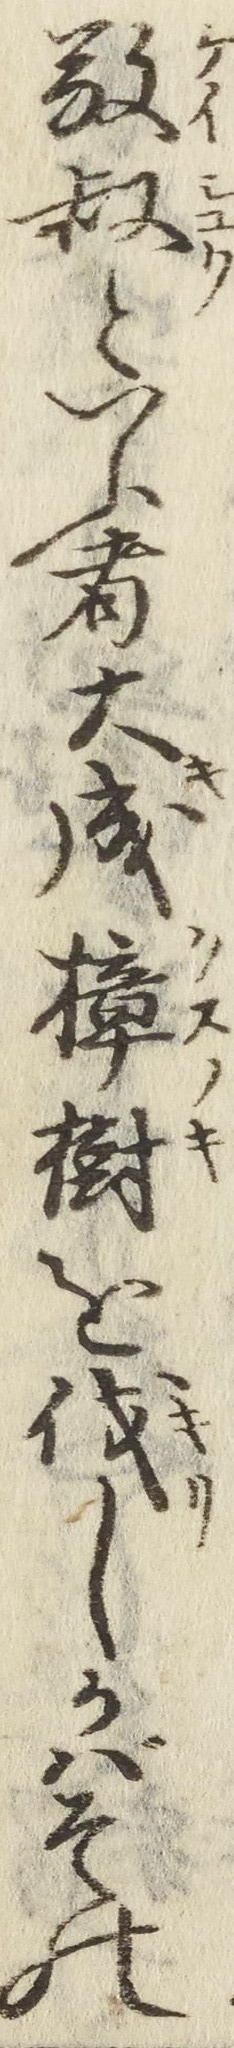敬叔といふ者大キ成樟樹を伐しかばその

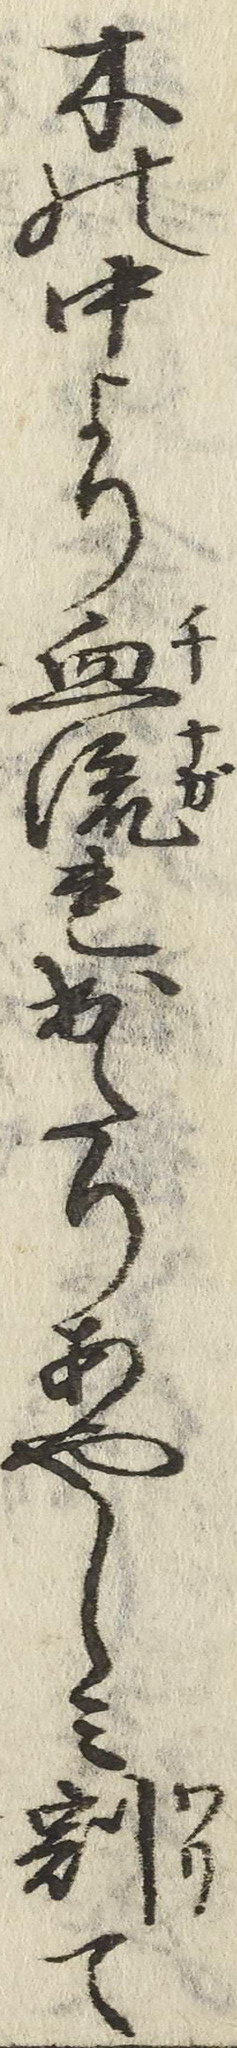木の中より血流れ出たりあやしみ割て
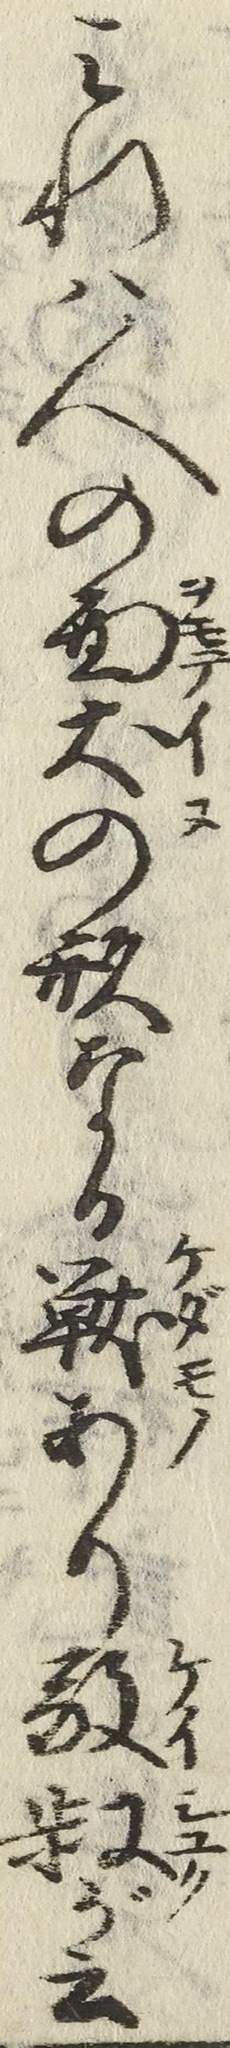みれは人の面犬の形なる獣あり敬叔が云
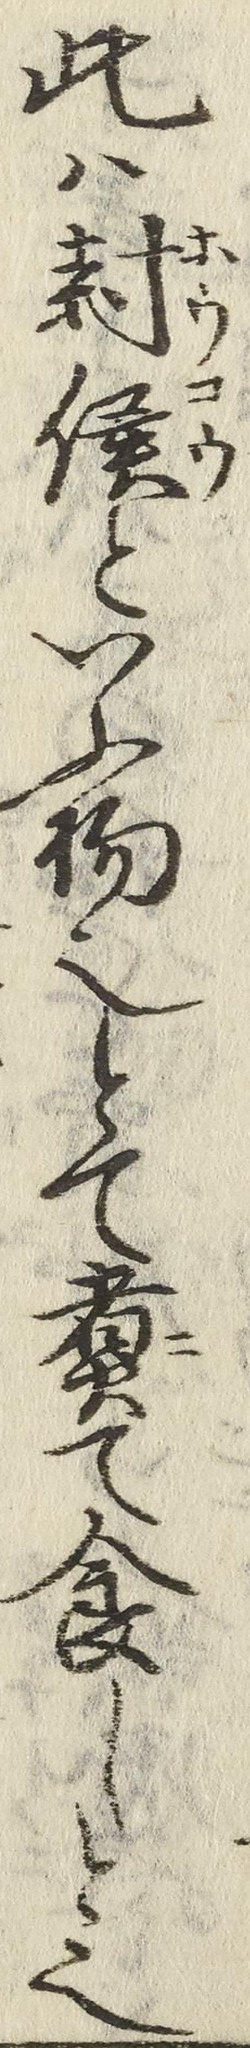此は封侯といふ物也とて煮て食しと也
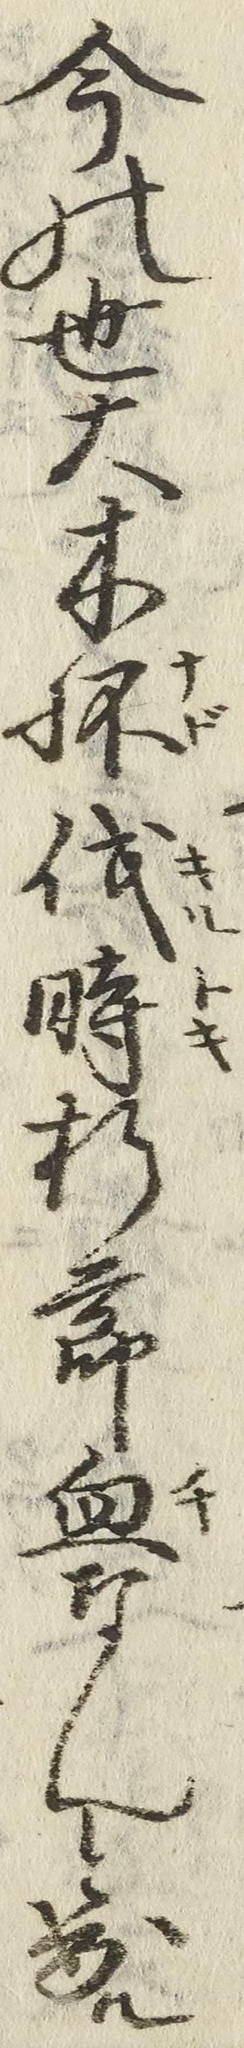今の世大木抔伐時折節血なんと出ル
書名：天地或問珍　天
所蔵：東京大学地震研究所図書室 Earthquake Research Institute Library, The University of Tokyo, JAPAN
